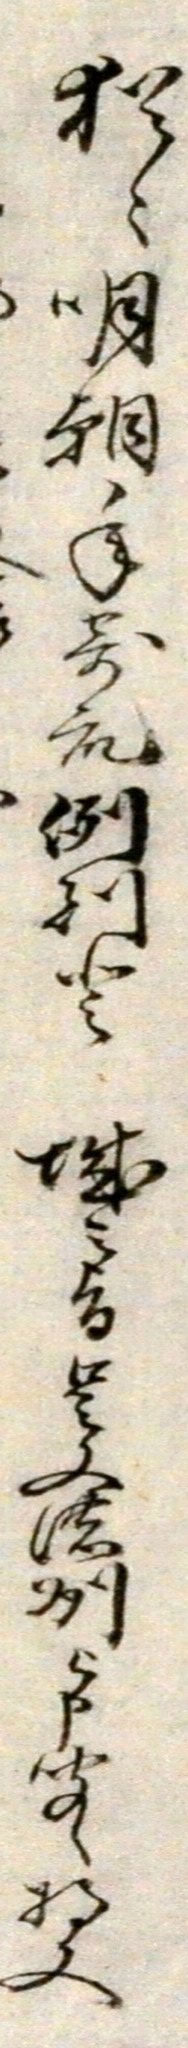猶々明朝年寄衆例刻登城之旨是又濃州被申聞候将又
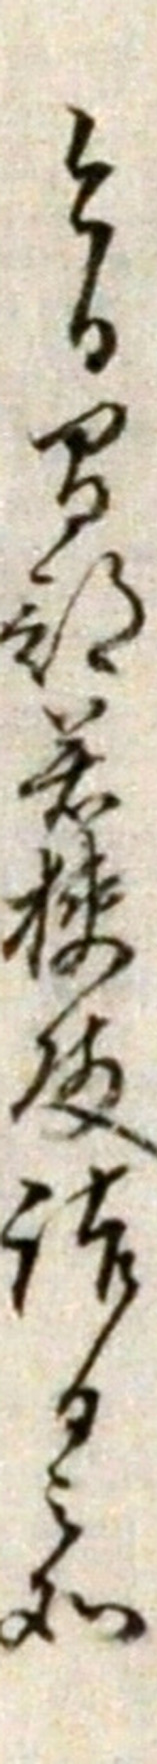今日間部若狭殿詰日之処
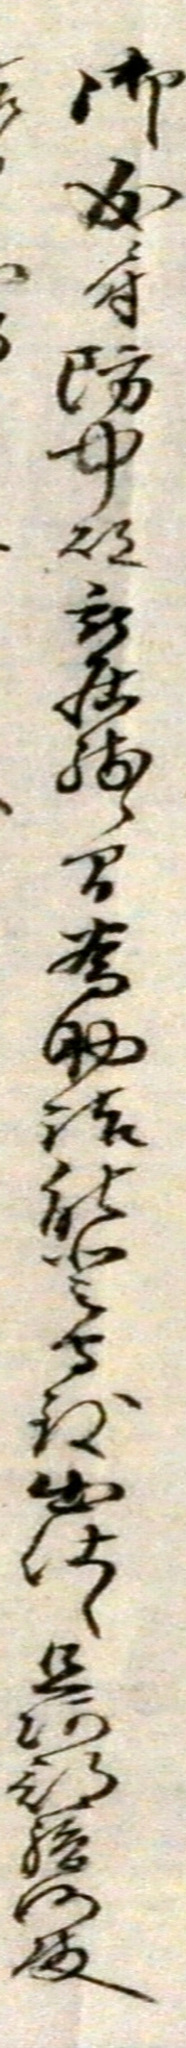御成ニ付防申故被居残候間為助詰能登守致出仕候且阿部駿河殿
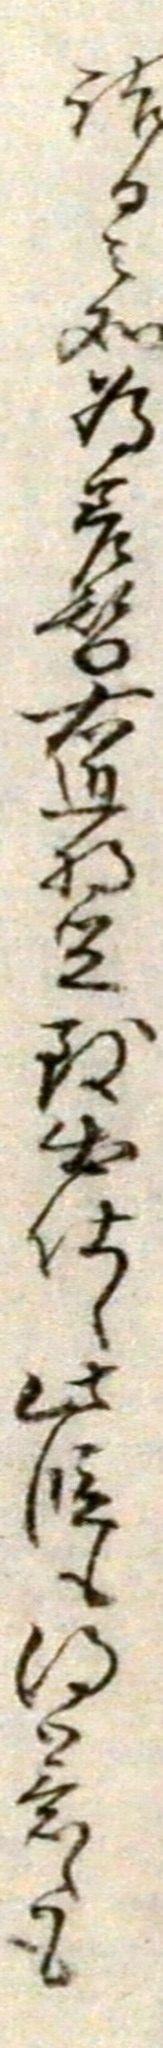詰日之処為差替右近将監致出仕候此段も得御意候以上

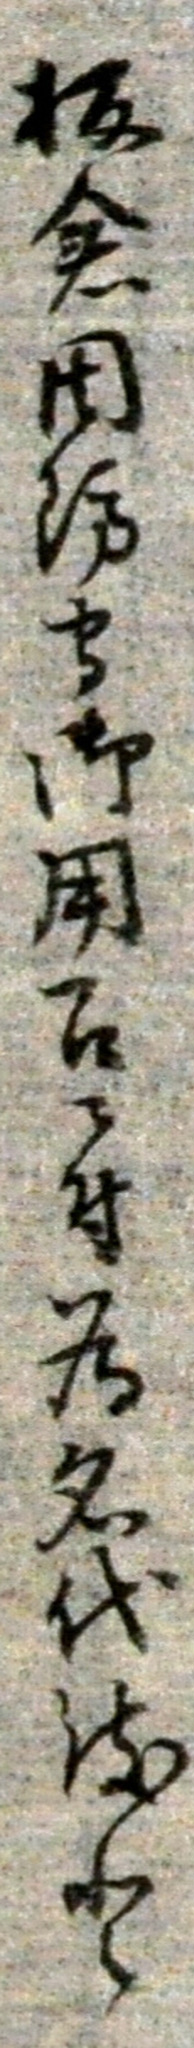板倉周防守御用召ニ付為名代致登
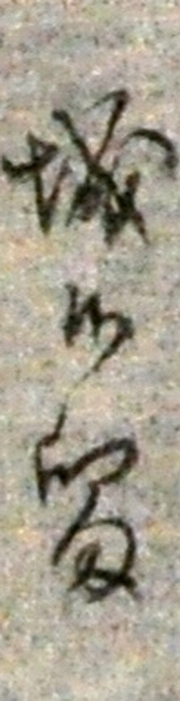城候留
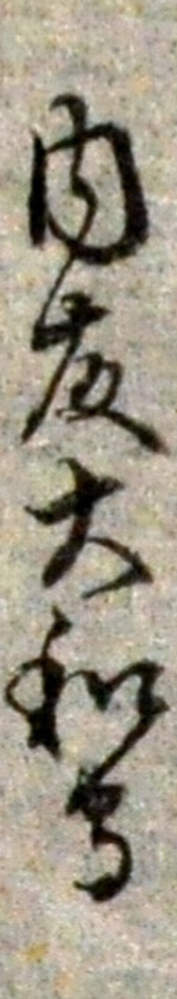内藤大和守
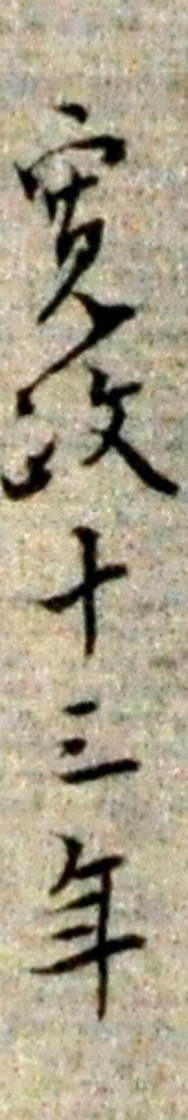寛政十三年
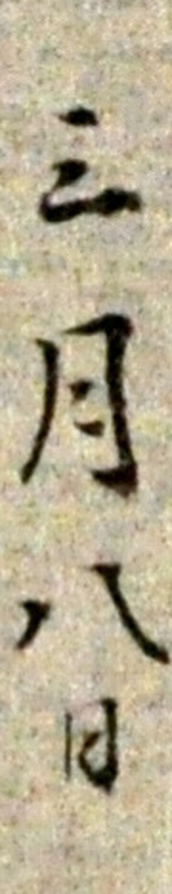三月八日
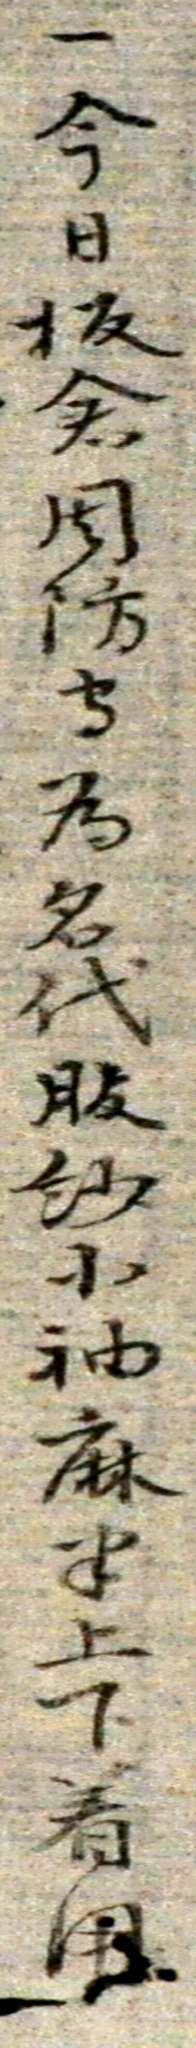一今日板倉周防守為名代服紗小袖麻半上下着用
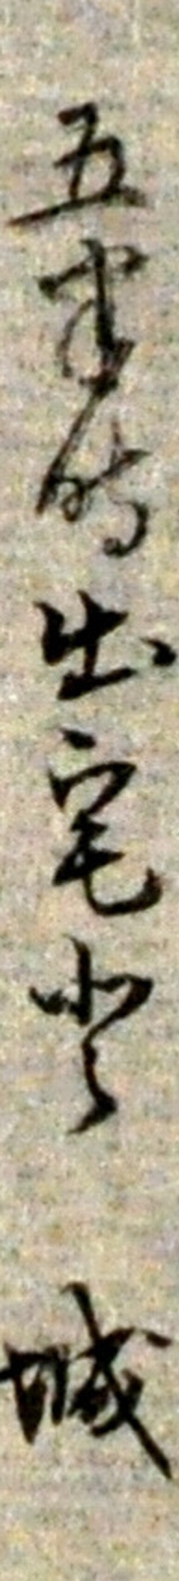五半時出宅登城
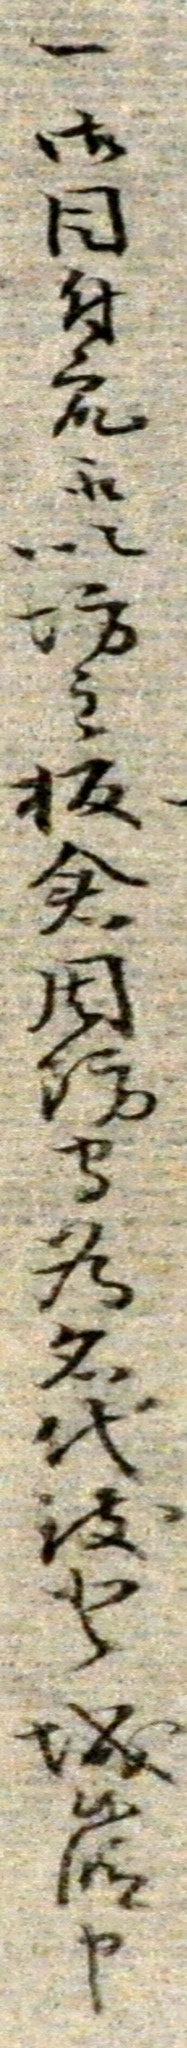一御目付衆え以坊主板倉周防守為名代致登城候段申
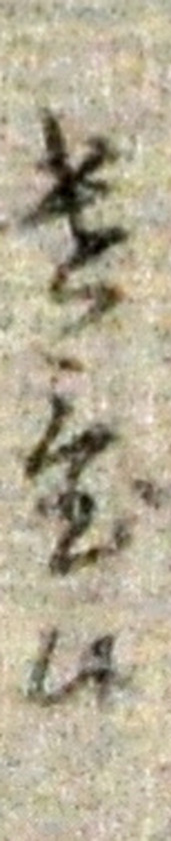遣置候
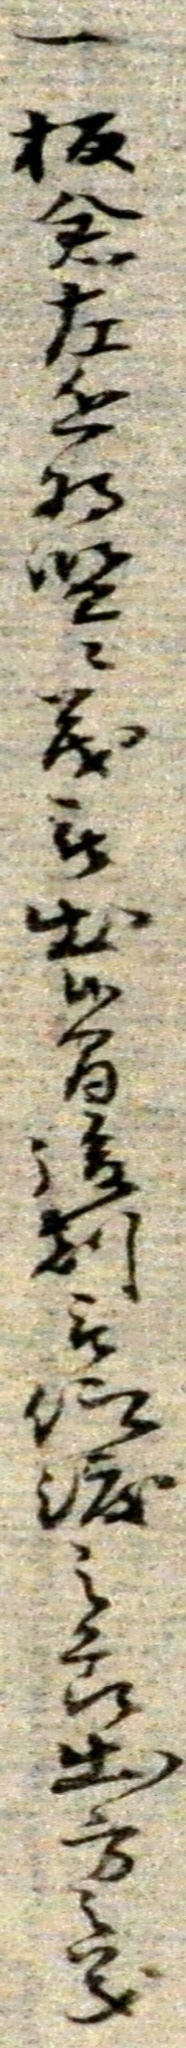一板倉左近将監にも被出候間後刻被仰渡之節出方之義
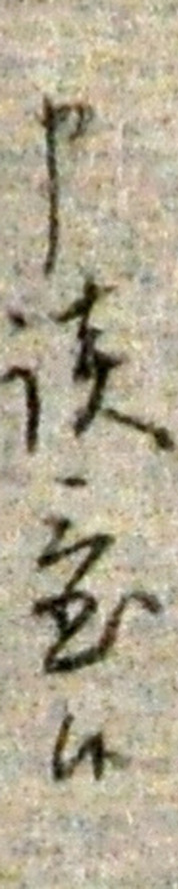申談置候
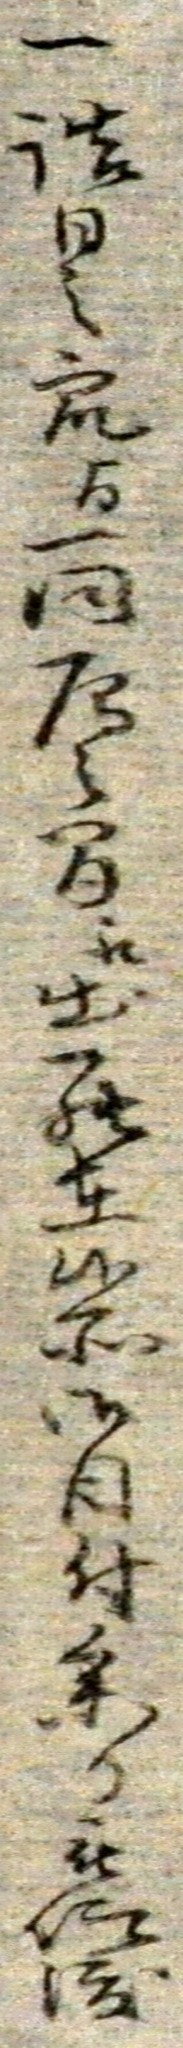一詰日之衆ゟ一同雁之間え出罷在候所御目付参り被仰渡
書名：諸名代相勤候節ノ留書外
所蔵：伊那市立高遠町図書館・合同会社AMANE
